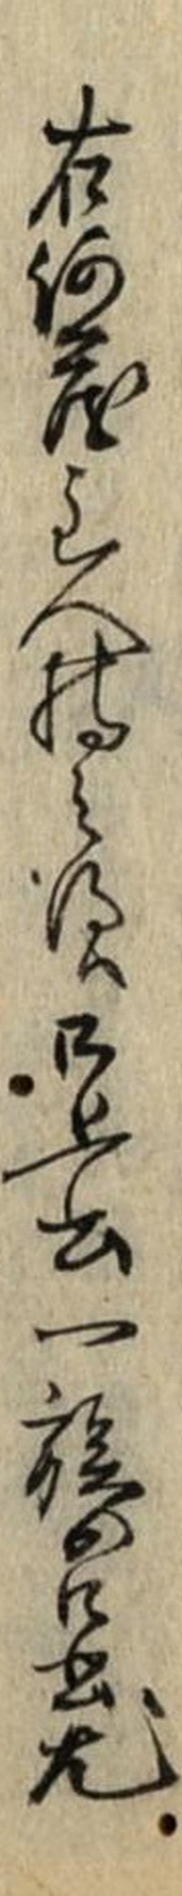右何も主人持に候得は口上書一族ゟ口書尤
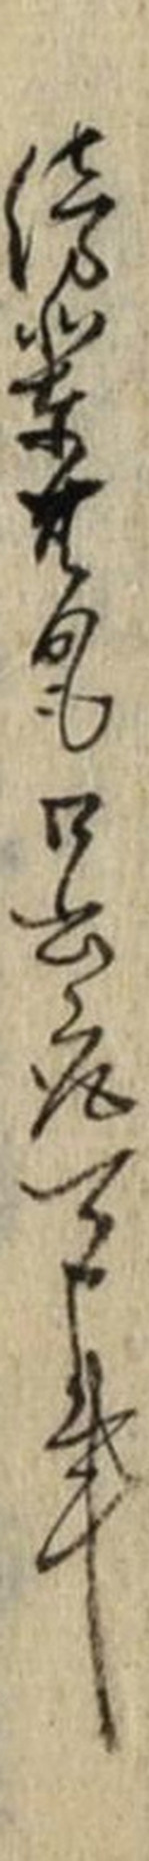傍輩共ゟも口書取可申事
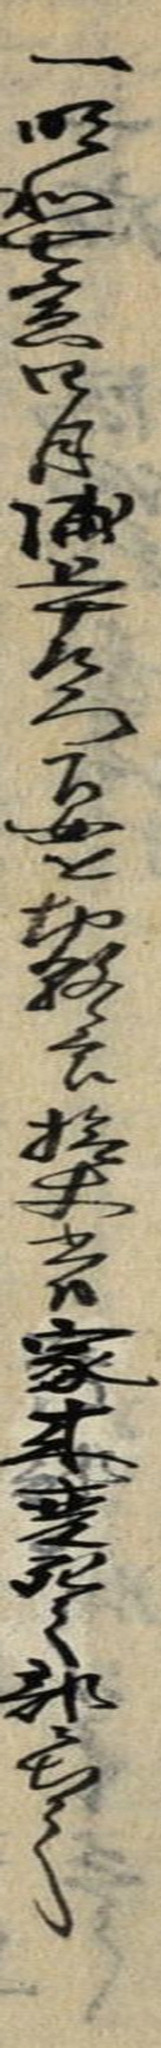一明和七寅四月浦上十左衛門下女を切殺候節検使書付家来変死之部に出之
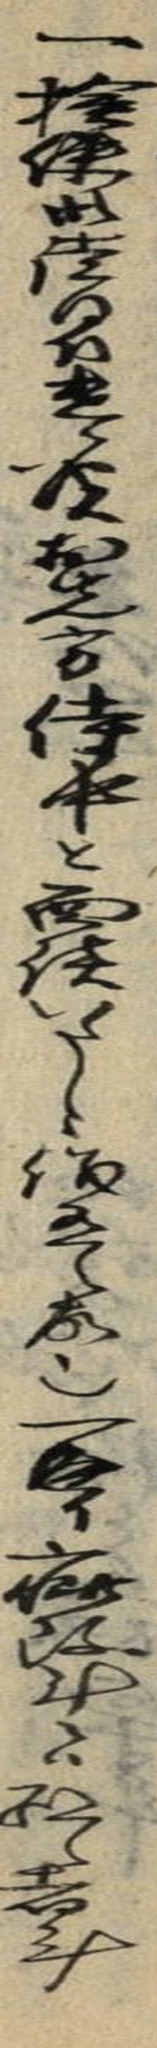一検使御徒目付遣候儀は於先方侍中と面談いたし候儀有之故也一通り疵改斗には組之者斗
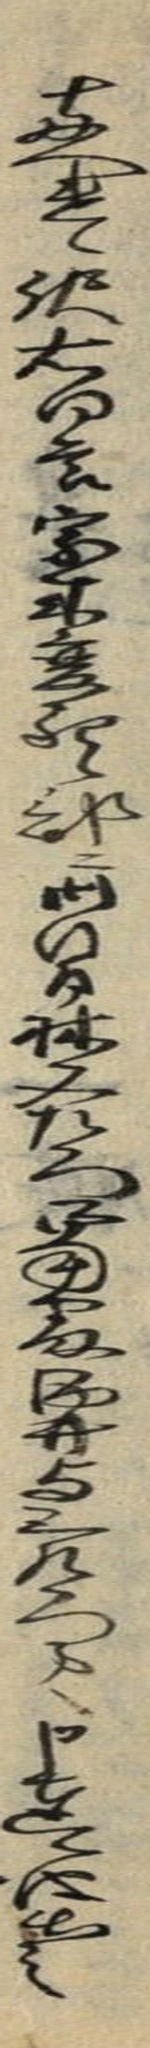両人遣候訳右同節家来変死之部に御目付林又左衛門御用番酒井与三左衛門方へ申達之儀出之
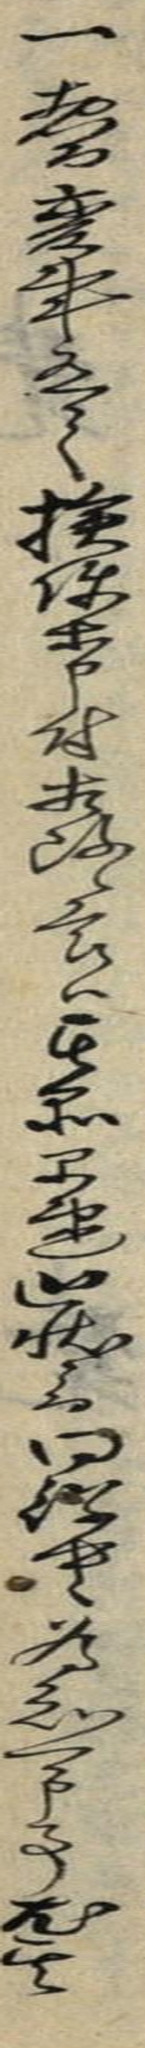一惣て変事有之検使等申付相改候節は其品早速廻状にて同役中へ為知可申事尤其
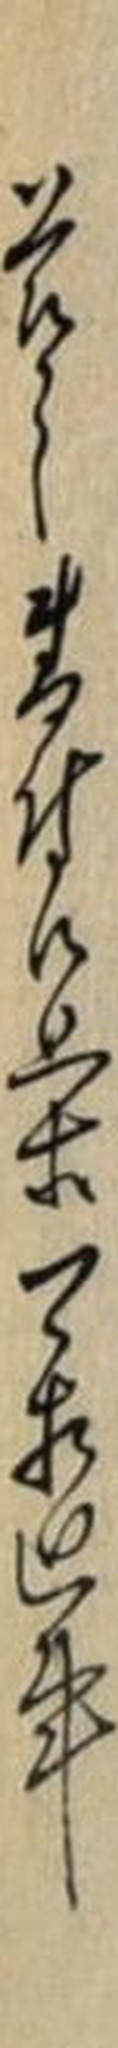節之書付口上等可相廻事

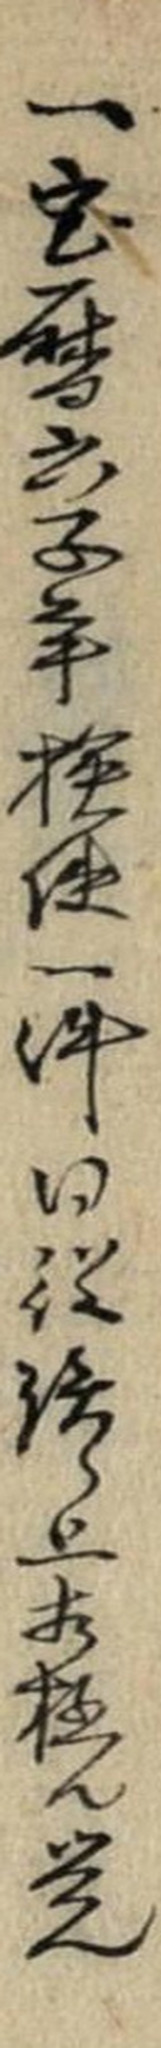一宝暦六子年検使一件同役談候上相極ル覚
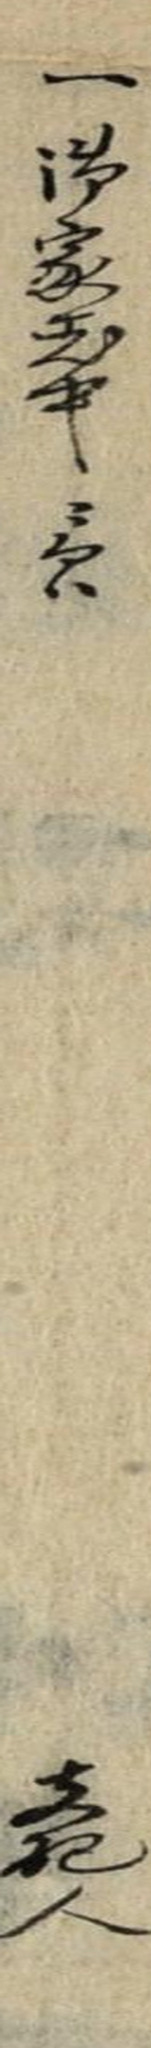一御家老中にては支配人
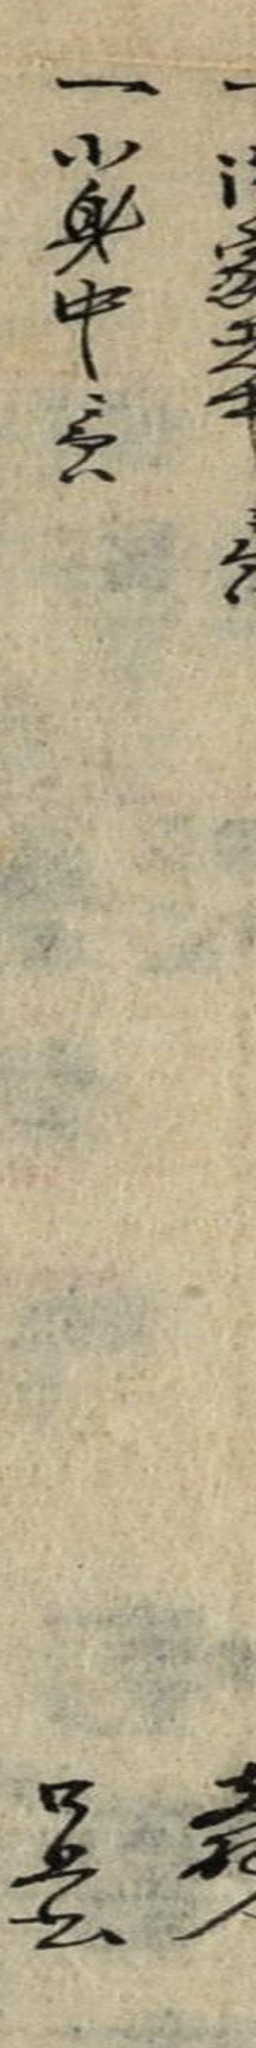一小身中にては口上書
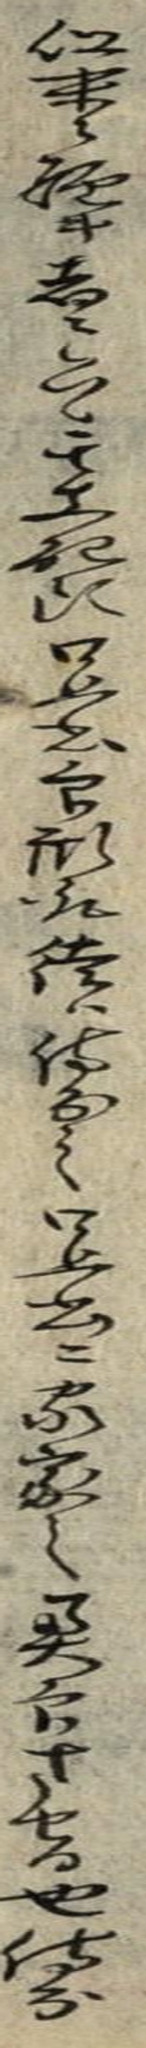但末々軽キ者に候はゝ其支配頭口上書印形取徒は侍分之口上書に家来之奥印させる也侍分
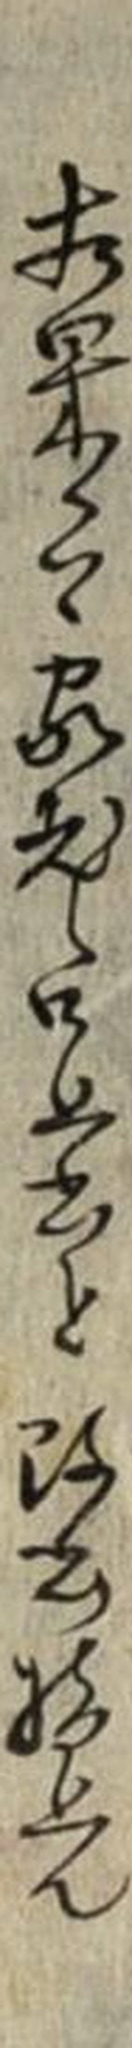相果候はゝ家老へ口上書と改書指上ル
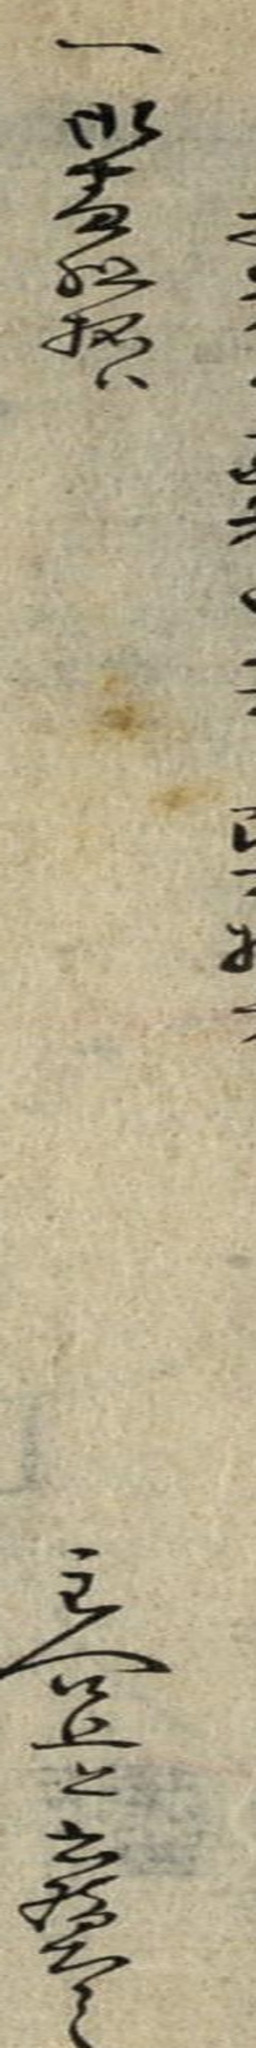一御番組抔は主人口上と書指出之
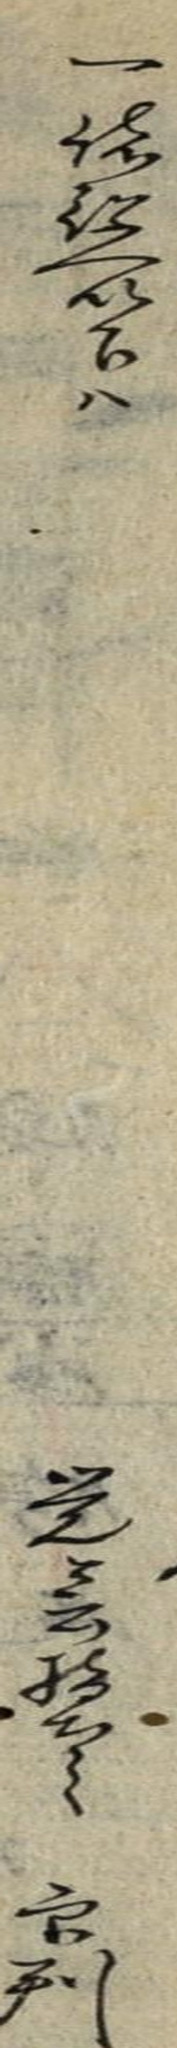一諸役人以下は覚と書指出之印判
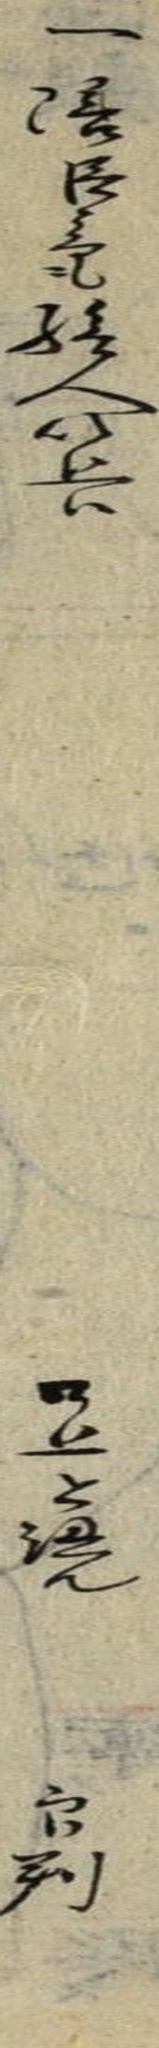一陪臣にても給人以上は口上と認ル印判
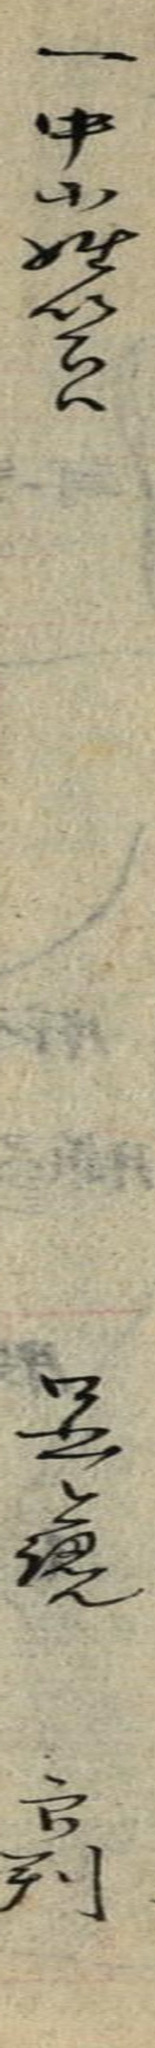一中小姓以下は口書と認ル印判
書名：御停止異変死失
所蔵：福井県文書館 Fukui Prefectural Archives
